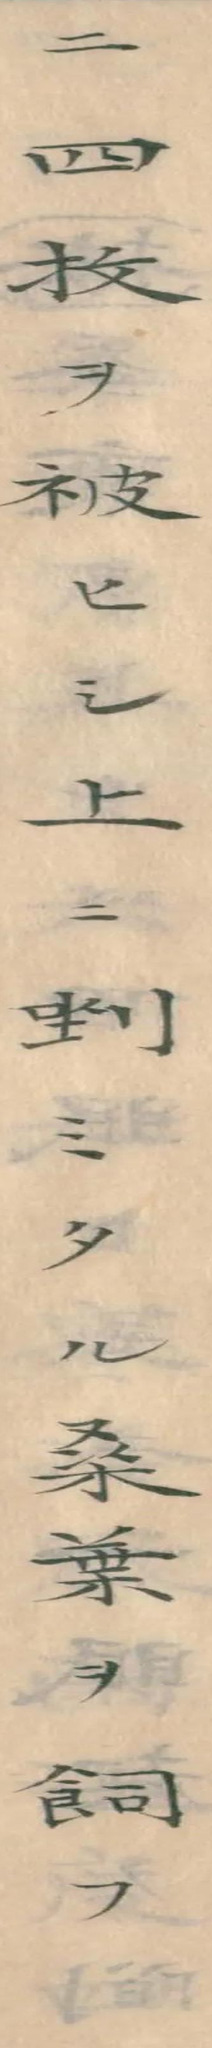ニ四枚ヲ被ヒシ上ニ剉ミタル桑葉ヲ飼フ
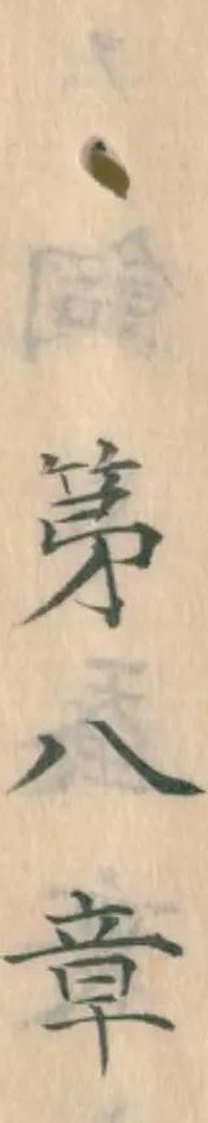第八章
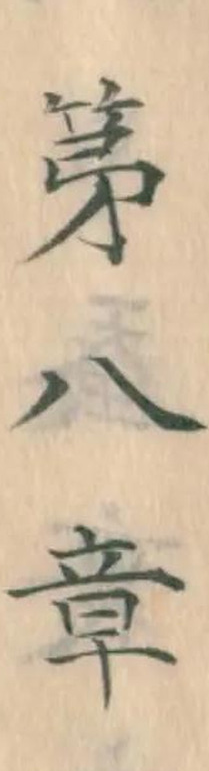第八章
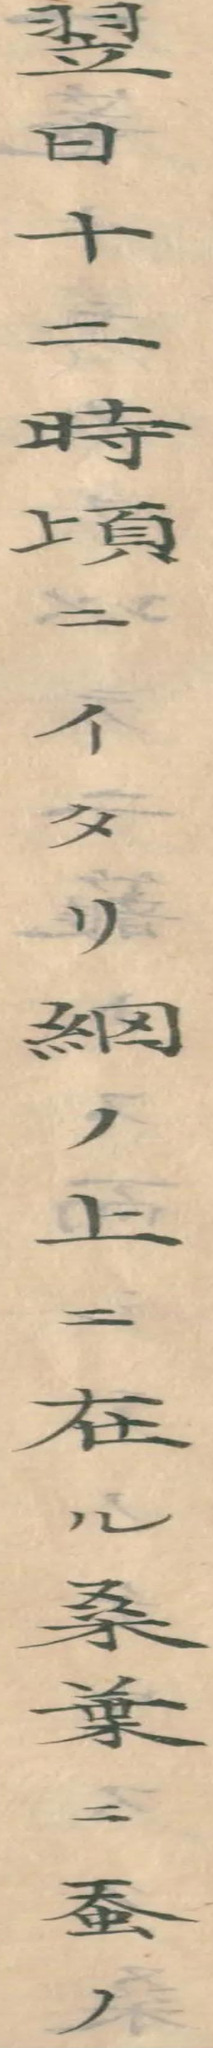翌日十二時頃ニイタリ網ノ上ニ在ル桑葉ニ蚕ノ
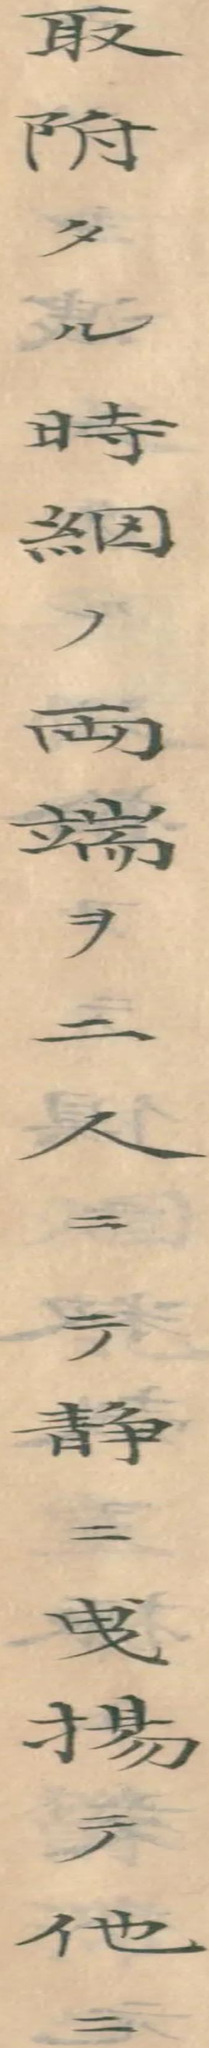取附タル時網ノ両端ヲ二人ニテ静ニ曳揚テ他ニ

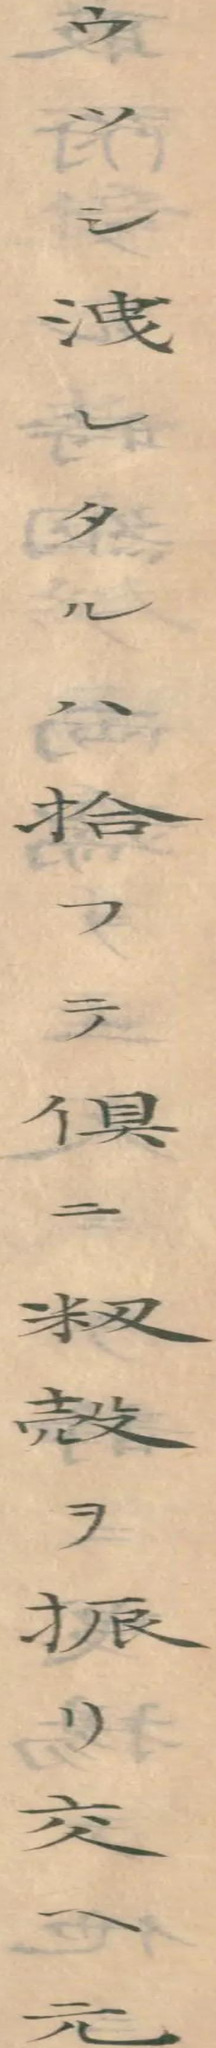ウツシ洩レタルハ拾フテ倶ニ籾穀ヲ振リ交ヘ元
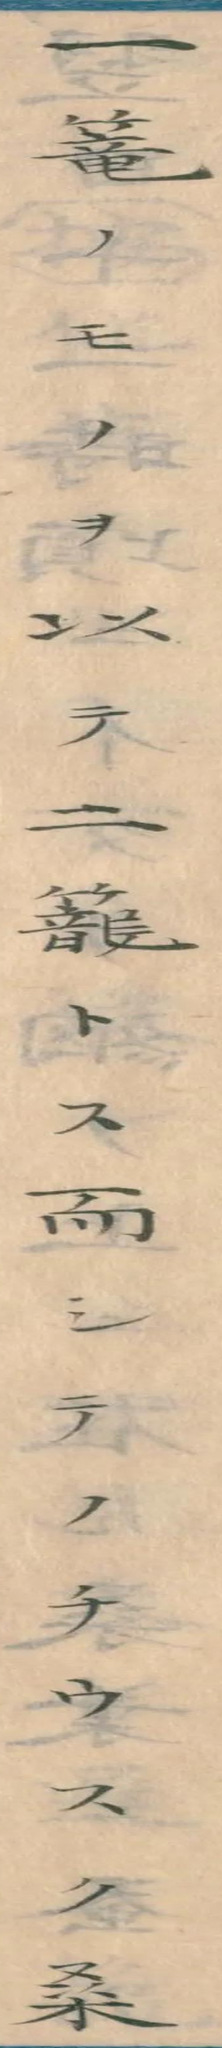一篭ノモノヲ以テ二籠トス而シテノチウスク桑
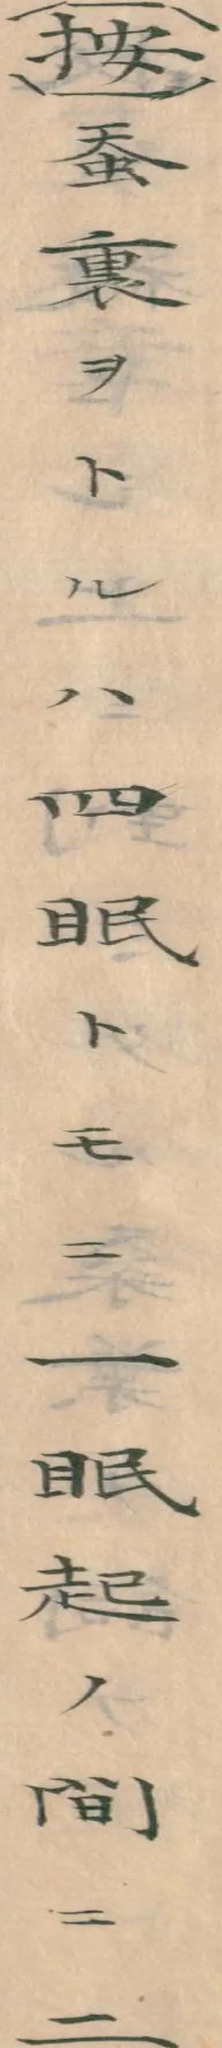[按]蚕裏ヲトルハ四眠トモニ一眠起ノ間ニ二
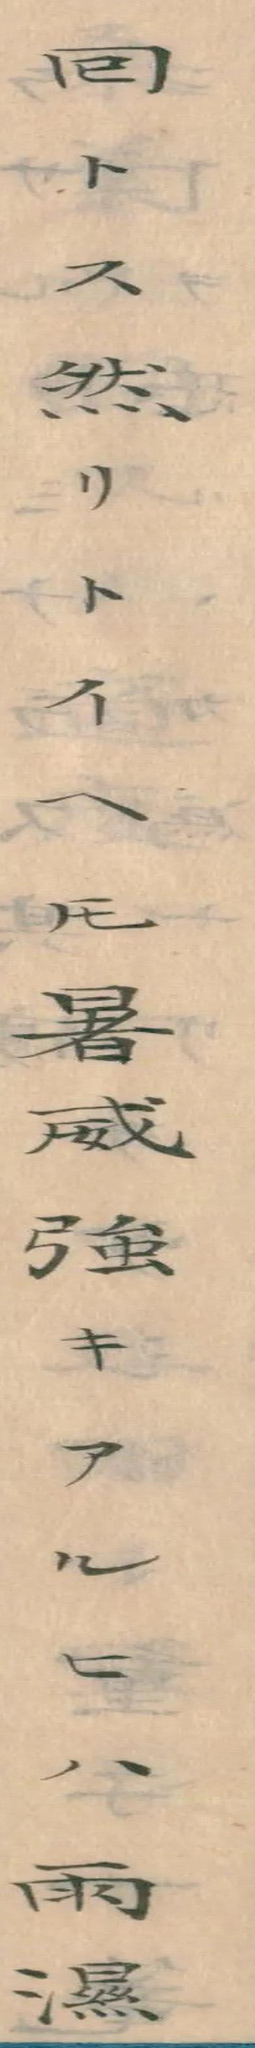回トス然リトイヘトモ暑威強キアルヒハ雨湿
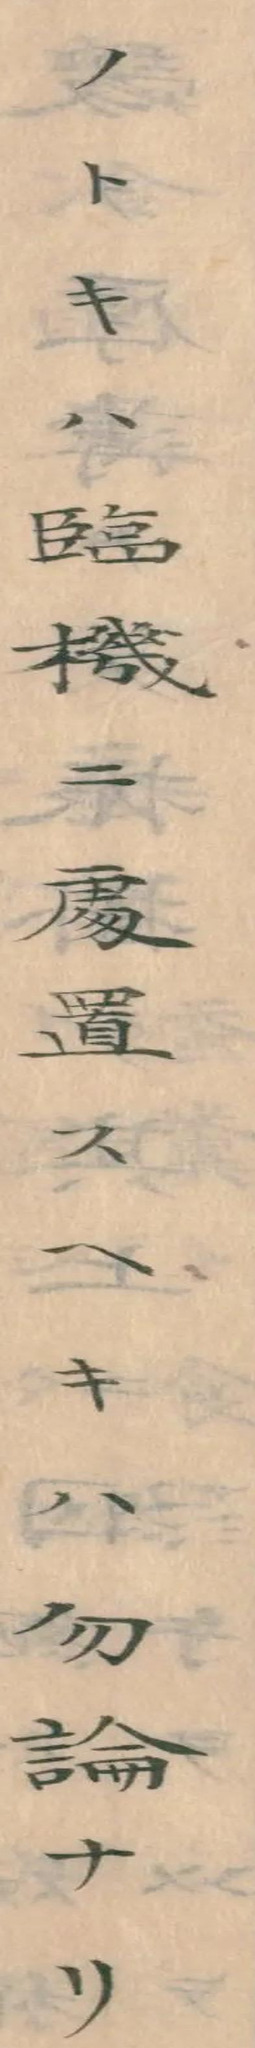ノトキハ臨機ニ処置スヘキハ勿論ナリ
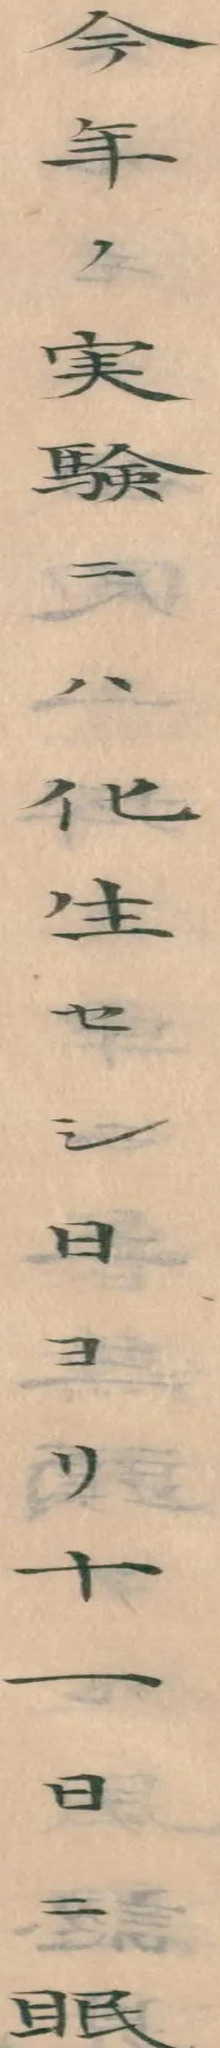今年ノ実験ニハ化生セシ日ヨリ十一日ニ眠
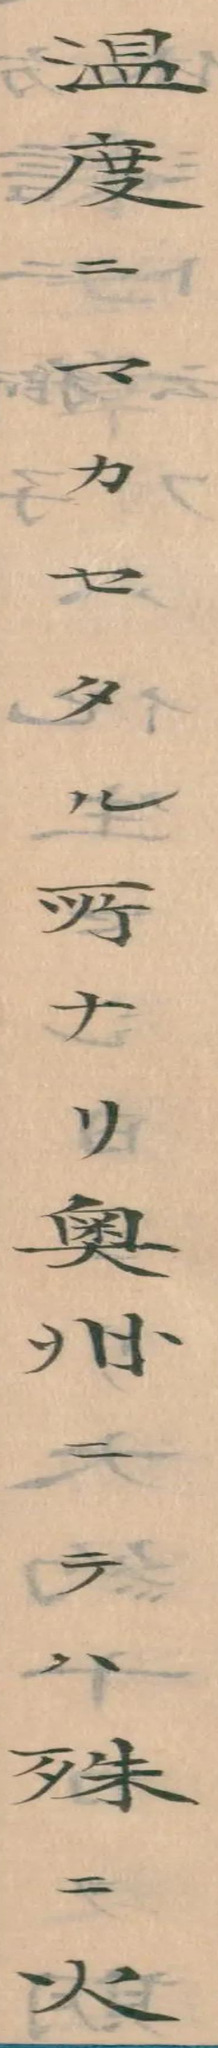温度ニマカセタル所ナリ奥州ニテハ殊ニ火
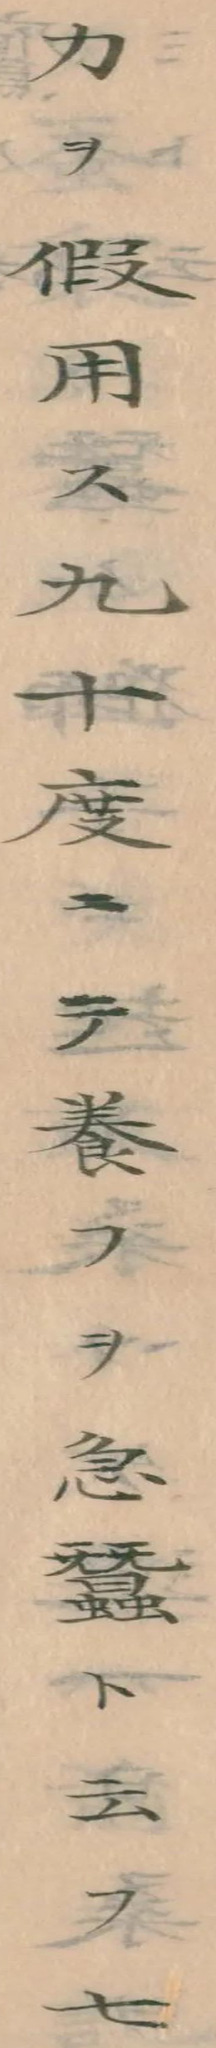力ヲ仮用ス九十度ニテ養フヲ急蚕ト云フ七
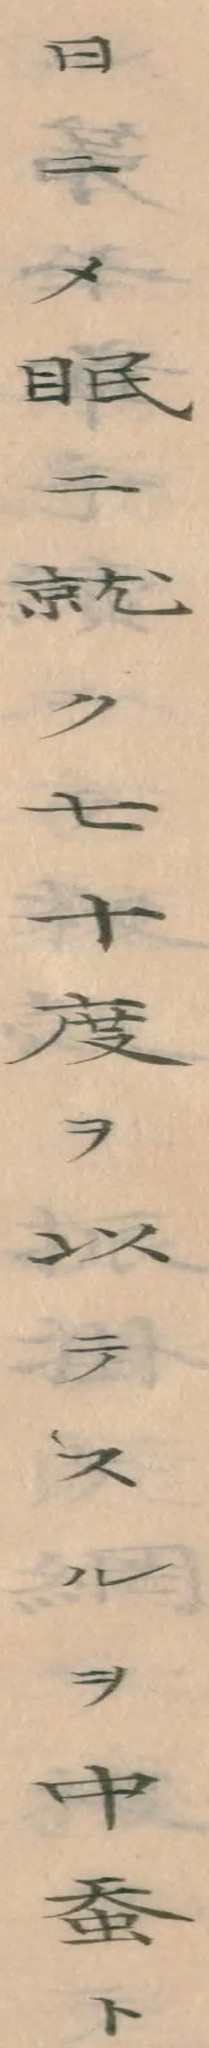日ニシテ眠ニ就ク七十度ヲ以テスルヲ中蚕ト
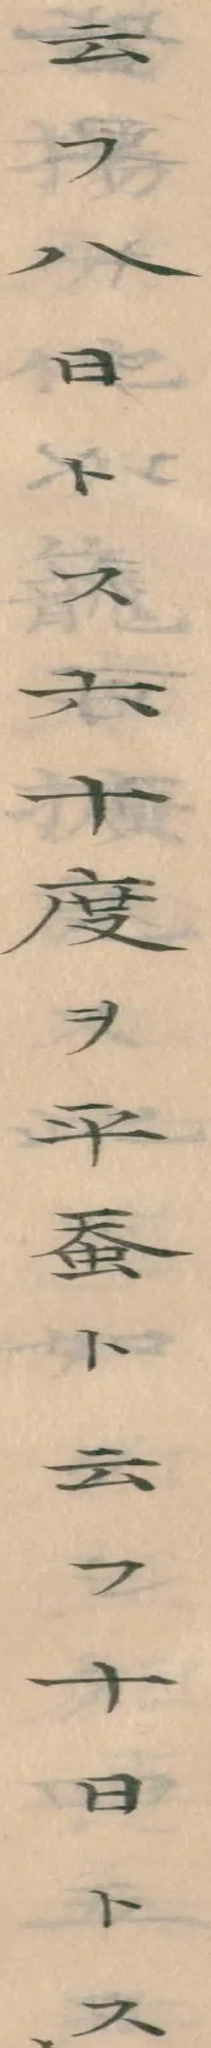云フ八日トス六十度ヲ平蚕ト云フ十日トス」
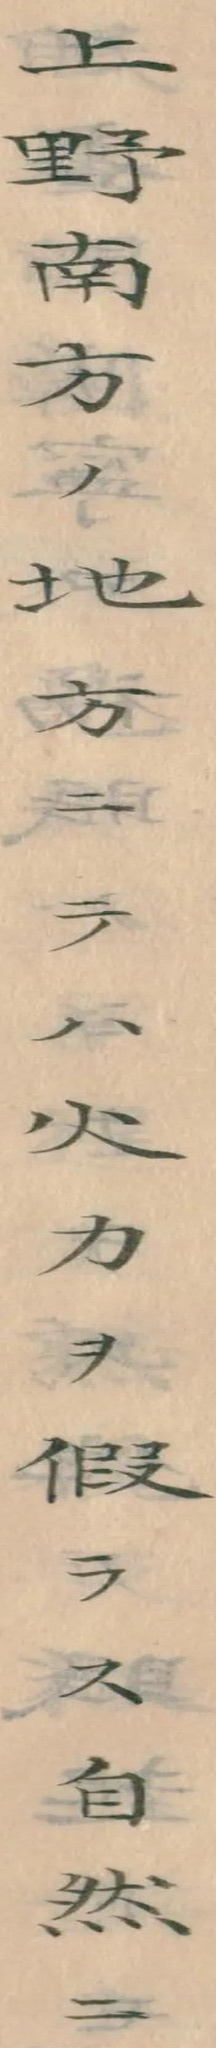上野南方ノ地方ニテハ火力ヲ仮ラス自然ニ
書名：蚕桑集成
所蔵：国立国会図書館 National Diet Library, JAPAN
